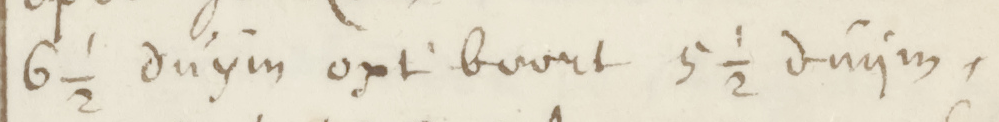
6½ duijm opt' boort 5½ duijm,
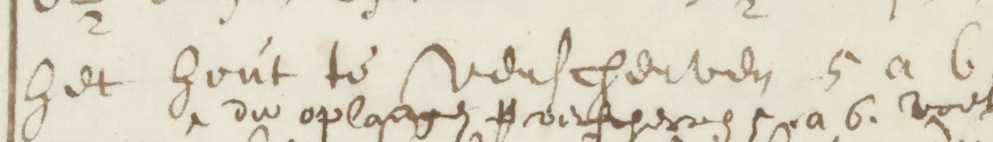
het hout te verscherven 5 a 6
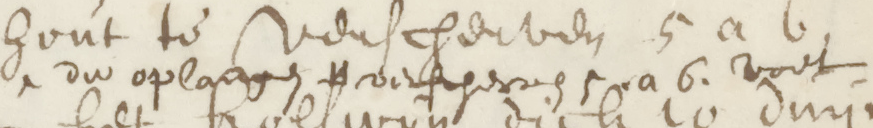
٨de oplangen te verscherven 5 a 6. voet٨
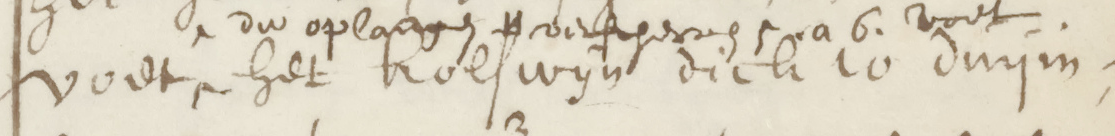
voet٨ het kolswijn dick 10 duijm,
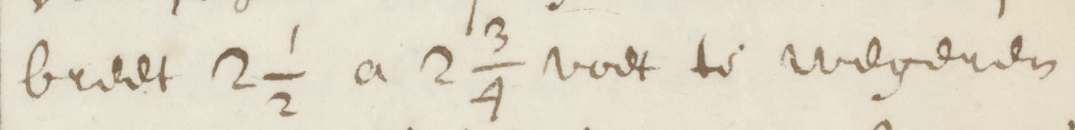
breet 2½ a 2¾ voet te wegeren
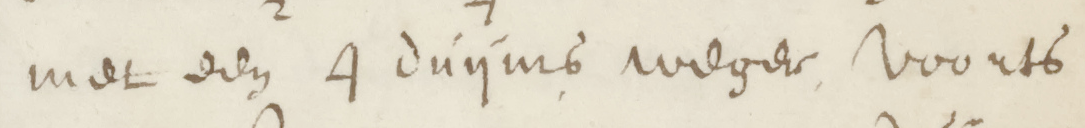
met een 4 duijms weger, voorts
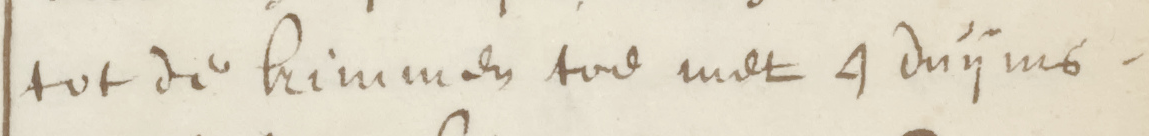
tot de kimmen toe met 4 duijms
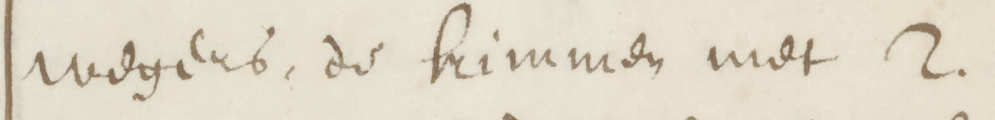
wegers, de kimmen met 2.
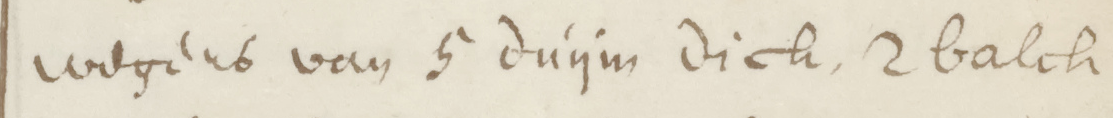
wegers van 5 duijm dick, 2 balck
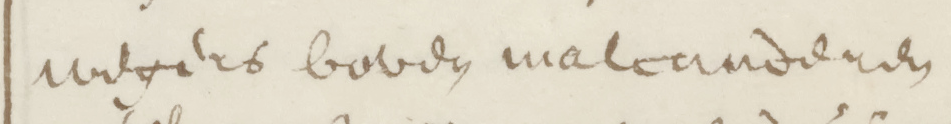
wegers boven malcanderen
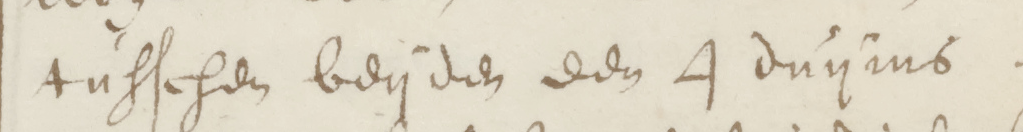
tusschen beijden een 4 duijms
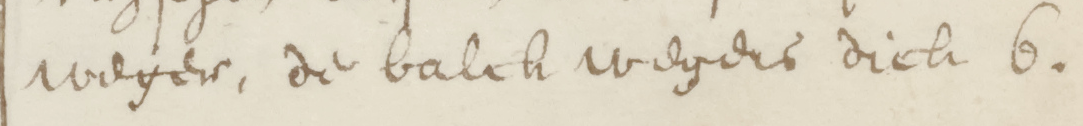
weger, de balck wegers dick 6.
